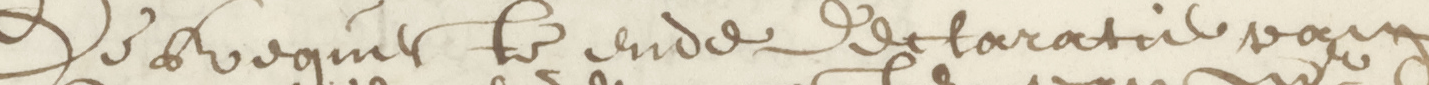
De Requeste ende Declaratie van
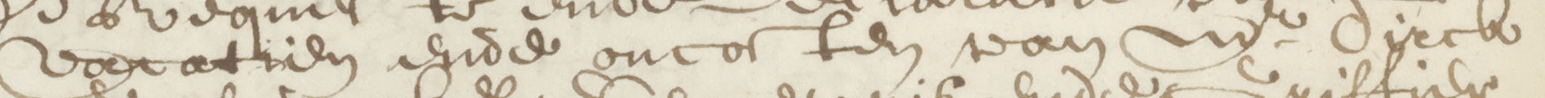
vacatien ende oncosten van Mr. Dirck
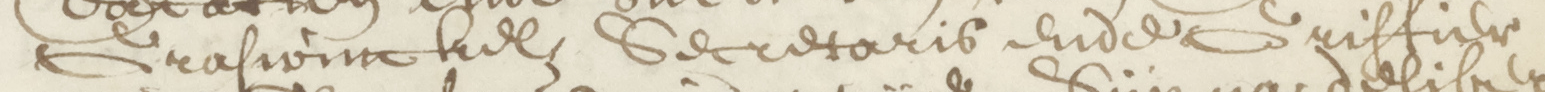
Graswinckel Secretaris ende Griffier
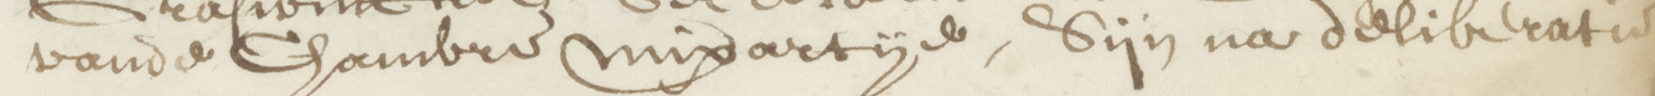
vande Chambre mipartije, Sijn na deliberatie
